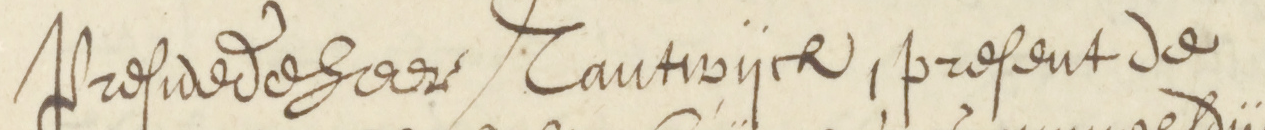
Preside de heer Rantwyck, present de
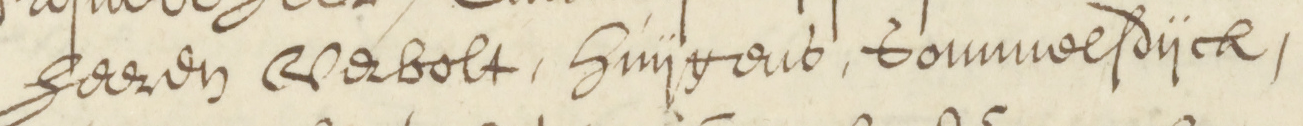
heeren Verbolt, Huijgens, Sommelsdijck,
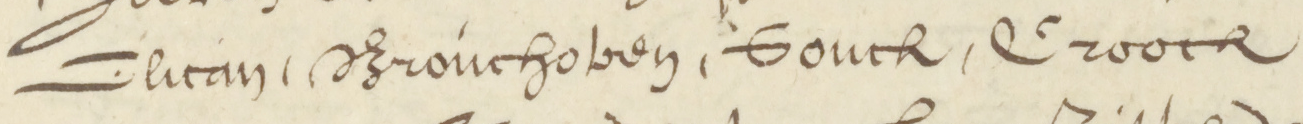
Olican, Brouchoven, Sonck, Croock
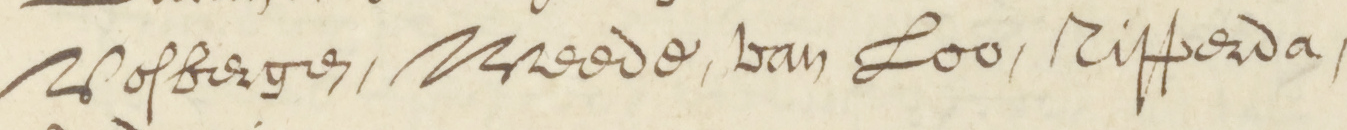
Vosbergen, Weede, van Loo, Ripperda,
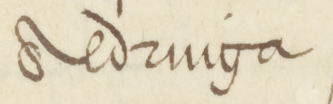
Aldringa
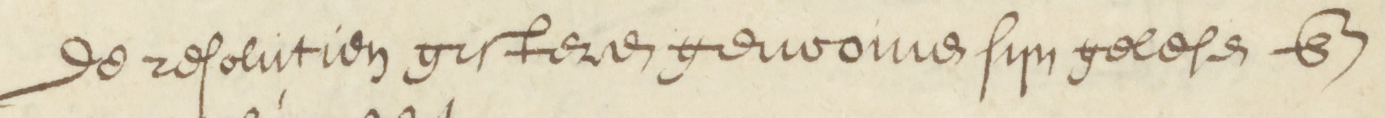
De resolutien gisteren genoomen syn gelesen &
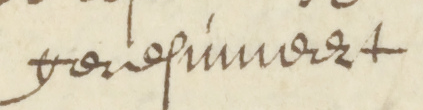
geresumeert
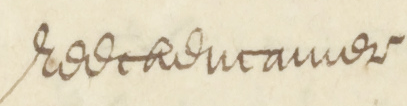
reeckencamer
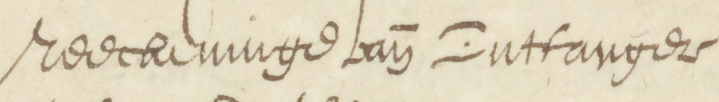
reeckeninge van Ontfanger
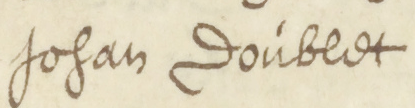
Johan Doublet
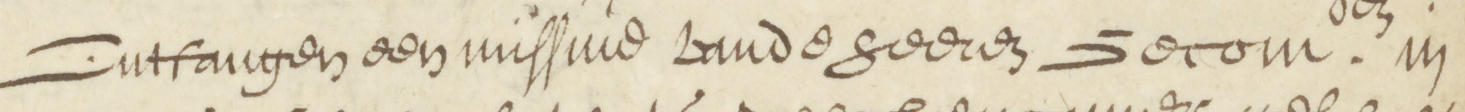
Ontfangen een missiue vande heeren Gecomden. in
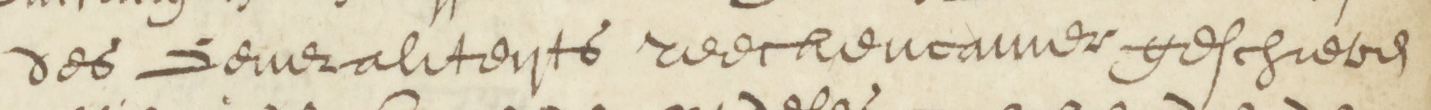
des Generaliteyts reeckencamer geschreven
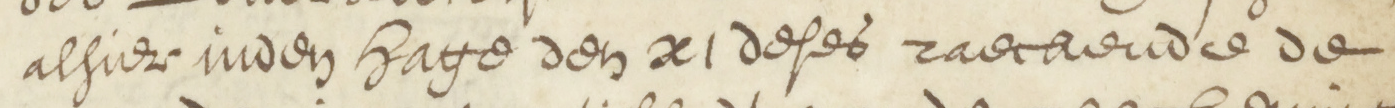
alhier inden Hage den xi deses raeckende de
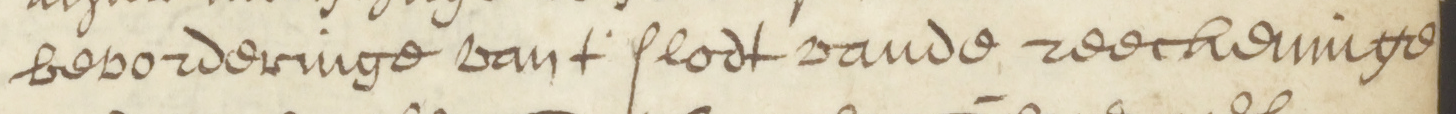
bevorderinge van t' slodt vande reeckeninge
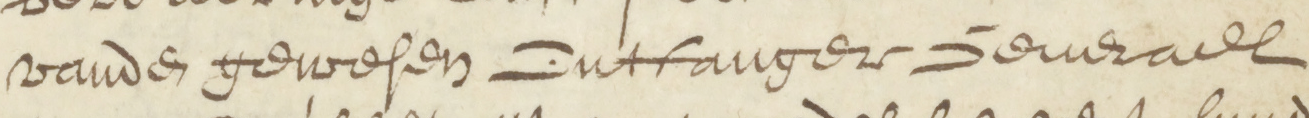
vanden gewesen Ontfanger Generael
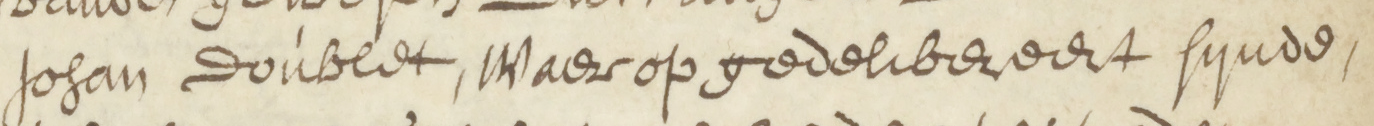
Johan Doublet. Waer op gedelibereert synde,
